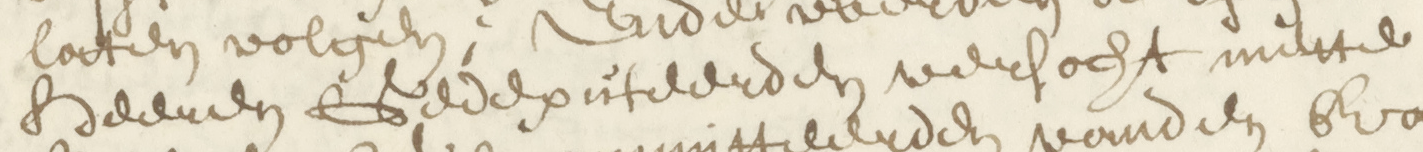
Heeren Gedeputeerden versocht mitte
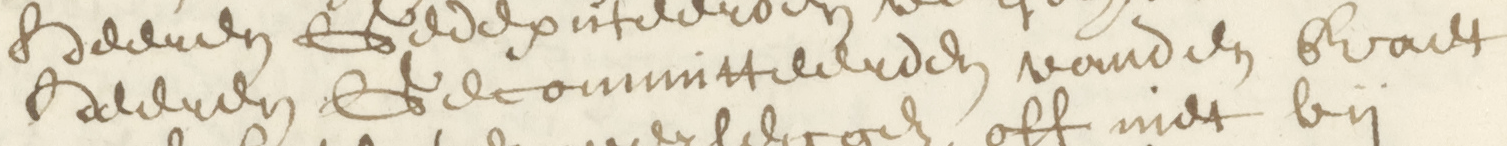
Heeren Gecommitteerden vanden Raet
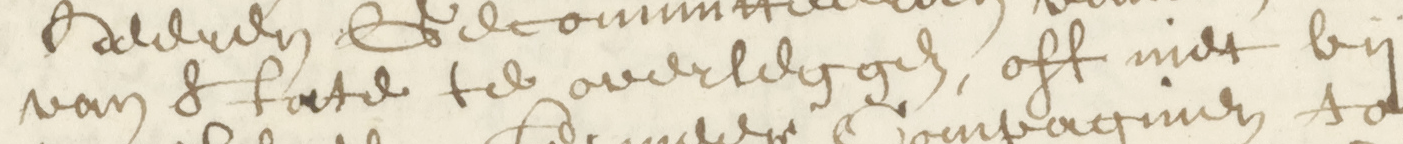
van State te overleggen, off niet bij
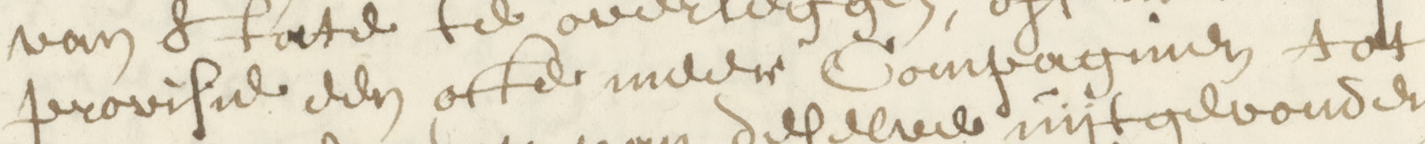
provisie een ofte meer Compagnien tot
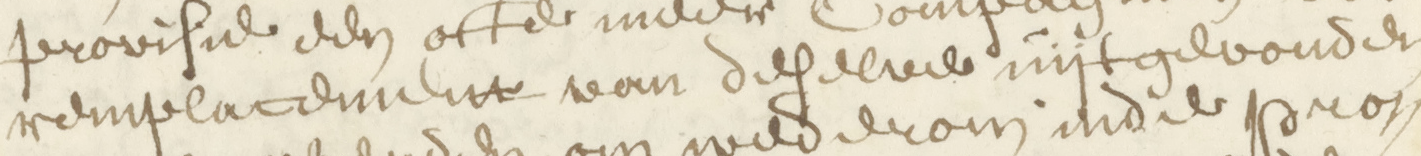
remplacement van deselve uijtgevonden
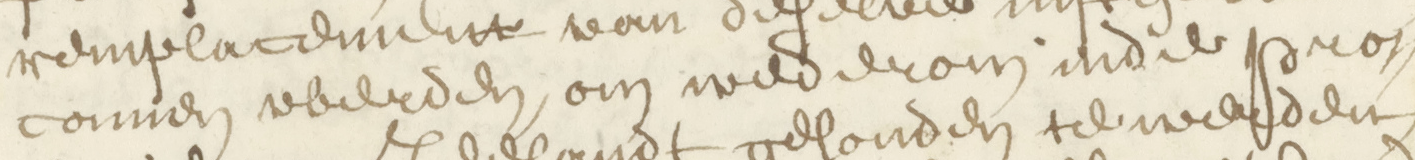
connen werden, om wederom inde Pro„,
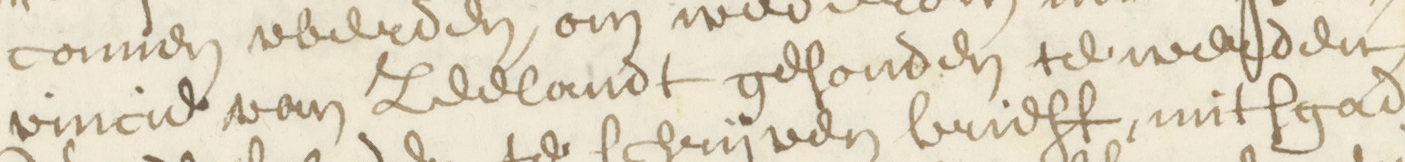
vincie van Zeelandt gesonden te werden,
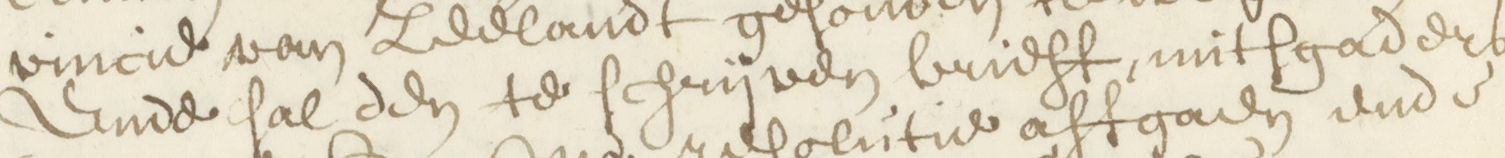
Ende sal den te schrijven brieff, mitsgaders
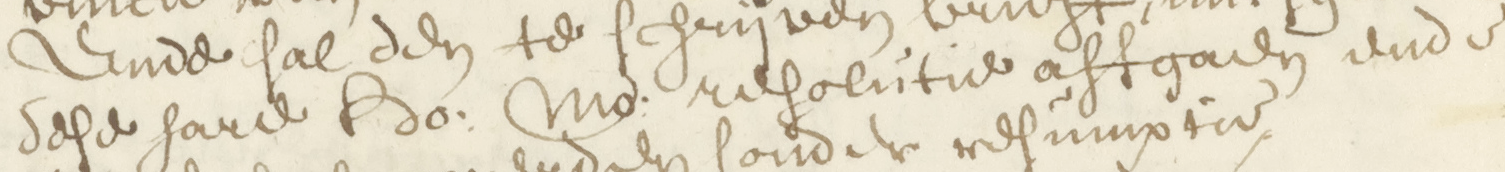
dese hare Ho:Mo: resolutie affgaen ende
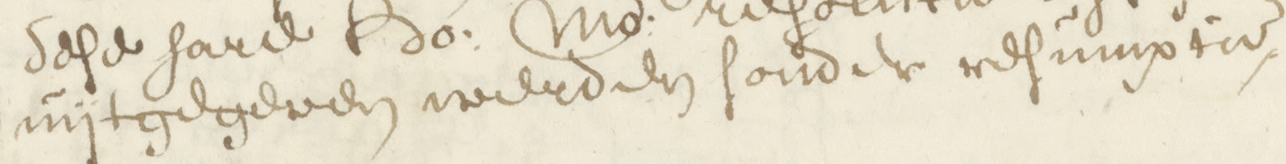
uijtgegeven werden sonder resumptie.
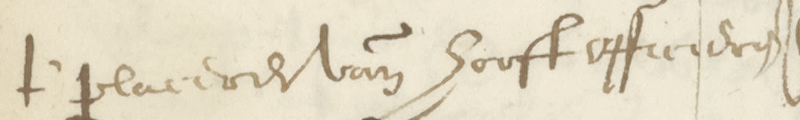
t' placeren van hooft officieren
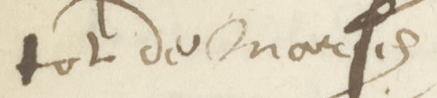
tot de Marsch.
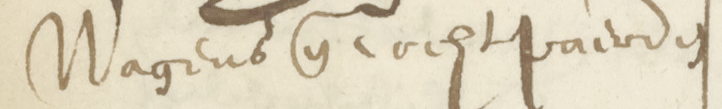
Wagens & tochtpaerden
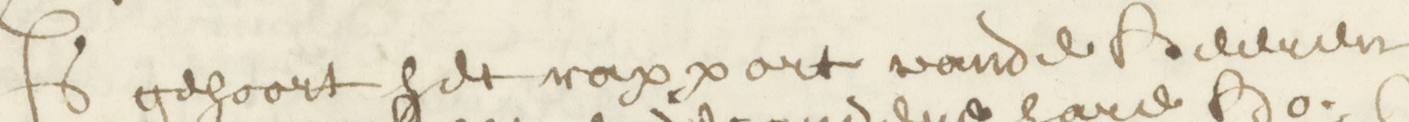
Is gehoort het rapport vande Heeren
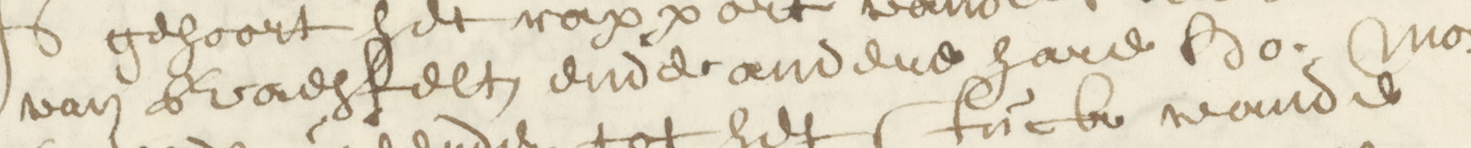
van Raesfelt, ende andere hare Ho:Mo:
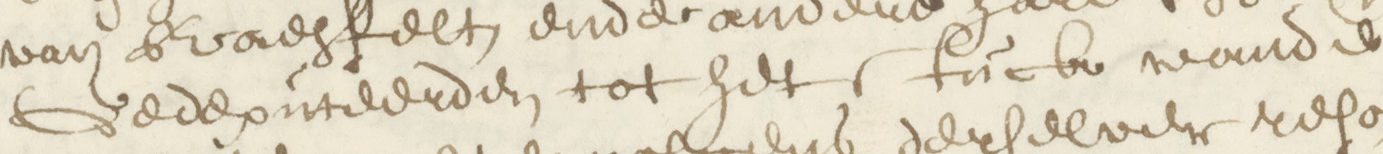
Gedeputeerden tot het stuck vande
